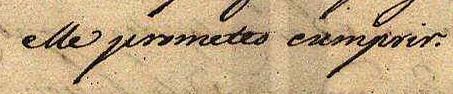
elle prometeo cumprir.
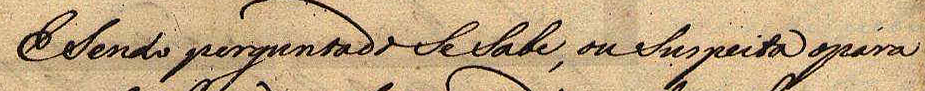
E Sendo perguntado Se Sabe, ou Suspeita o para
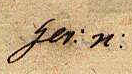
ger: n:
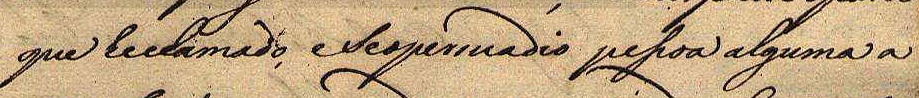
que he chamado, e se o persuadio pessoa alguma a
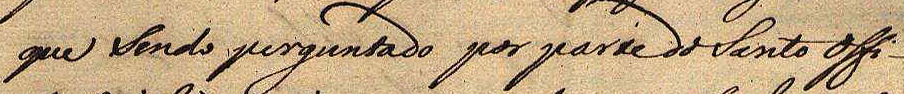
que sendo perguntado por parte do Santo offi
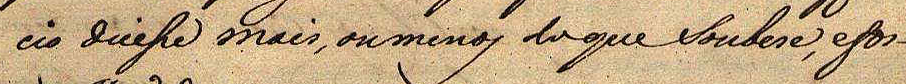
cio dicesse mais, ou menos do que Soubese, e fos
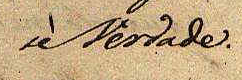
se Verdade.
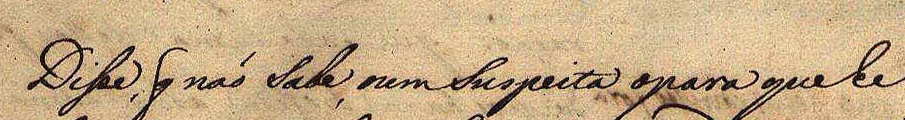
Disse, q̄ naõ sabe, nem suspeita o para que he
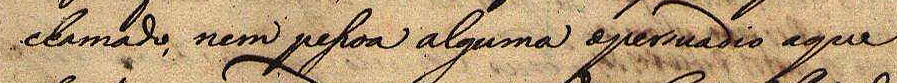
chamado, nem pessoa alguma o persuadio a que
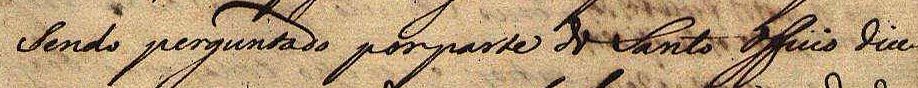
sendo perguntado por parte do Santo Officio dice
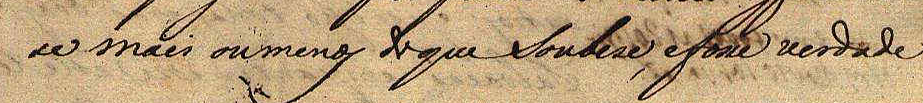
se mais ou menos do que Soubese, e fosse verdade
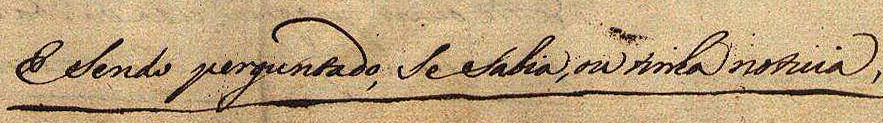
E Sendo perguntado, Se Sabia, ou tinha noticia,
